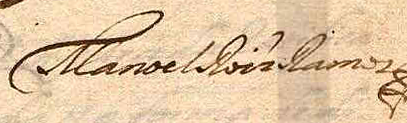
Manoel Roiz̄ Ramoz
